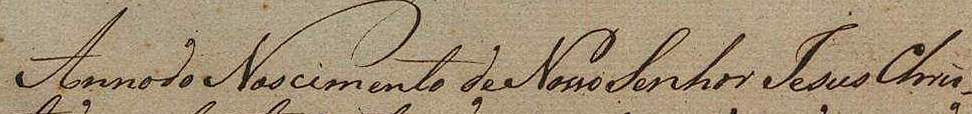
Anno do Nascimento de Nosso Senhor Iesus Chris
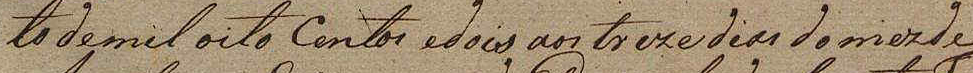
to de mil oito Centos e dois aos treze dias do mez de
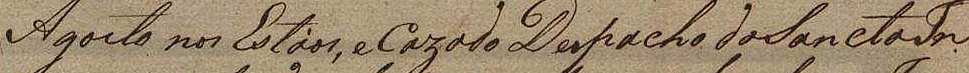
Agosto nos Estáos, e Caza do Despacho da Sancta In
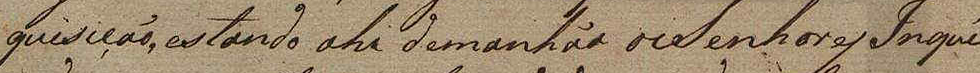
quisiçaõ, estando ahi de manhãa os Senhores Inqui
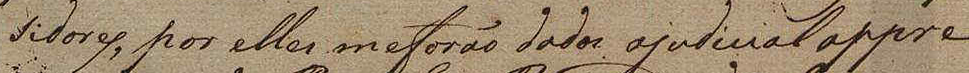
sidores, por elles me foraõ dados a judicial appre
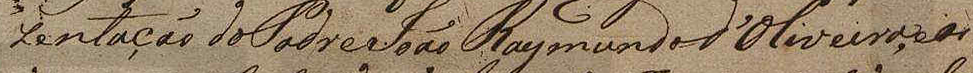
zentaçaõ do Padre João Raymundo d’Oliveira, e os
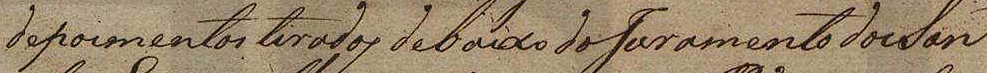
depoimentos tirados debaixo do Juramento dos San
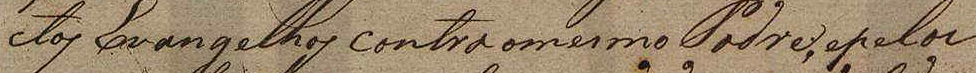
ctos Evangelhos contra o mesmo Padre, e pelos
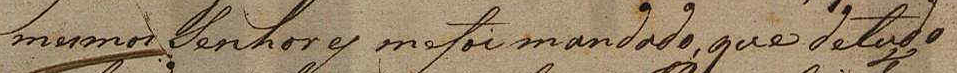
mesmos Senhores me foi mandado, que de tudo
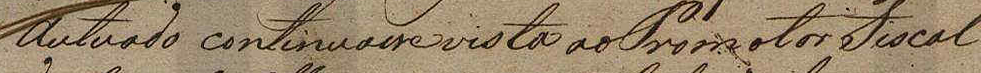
autuado continuasse vista ao Promotor Fiscal
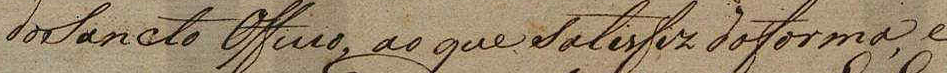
do Sancto Officio, ao que satisfiz da forma, e
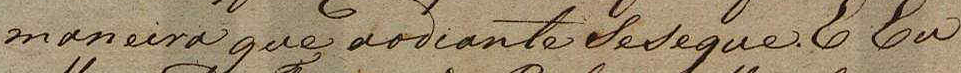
maneira que ao diante se segue. E Eu
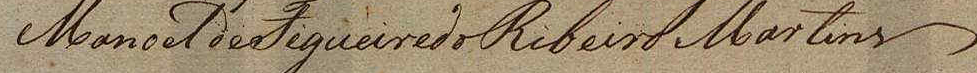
Manoel de Figueiredo Ribeiro Martins
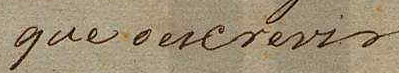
que o escrevi
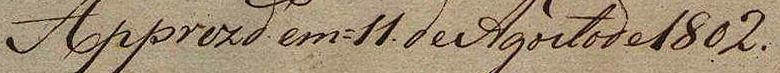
Apprezd.o em 11 de Agosto de 1802.
